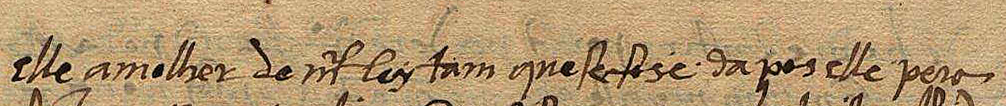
Elle a molher de mel leytam que se fose dapos elle pera
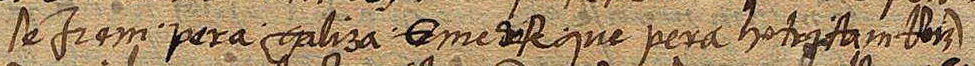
se Jrem pera galiza E me dise que pera ho tristam Roiz̄
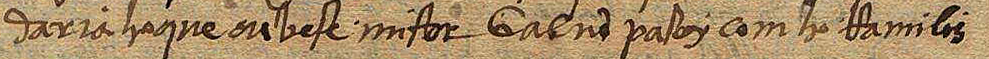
daria ho que ouvese mister E al nō pasey com ho Ramiliz
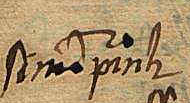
simō pinhro
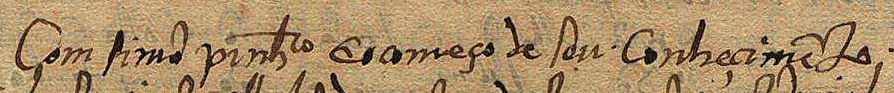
Com simō pinhro E o começo de seu Conheçimēto
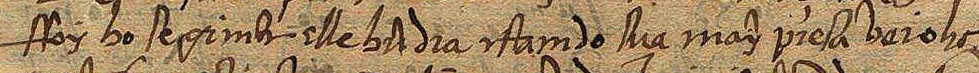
ffoy ho segimte Elle hū dia estamdo sua maỹ presa veio ha
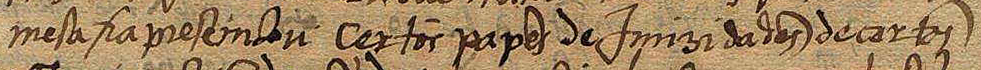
mesa e apresemtou certos papēs de Jmizidades de certas
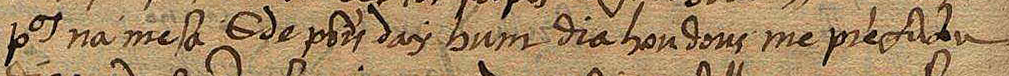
pas na mesa E depois day hum dia hou dous me pregūtou
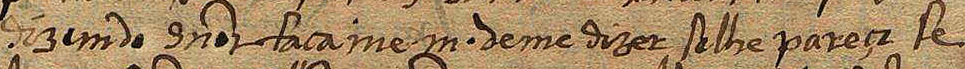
dizemdo snōr facame m. de me dizer se lhe pareçe se
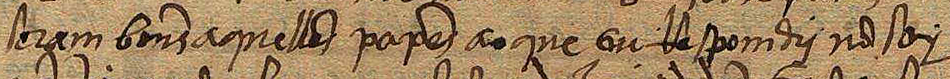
seram bons aquelles papēs ao que Eu Respomdij nō sey
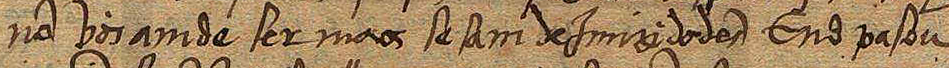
nō vos amde ser maos se sam de Jmizidades E nō pasou
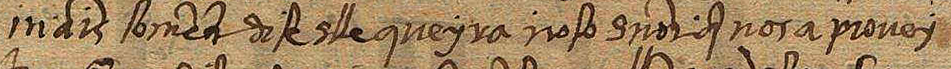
mais somēte dise Elle queyra noso snōr q̄ nos aprouey
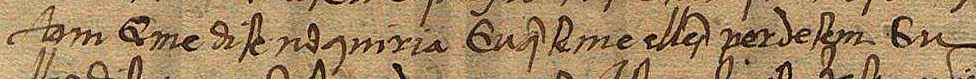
tem E me dise nō quiria Eu q̄ se me elles perdesem Eu
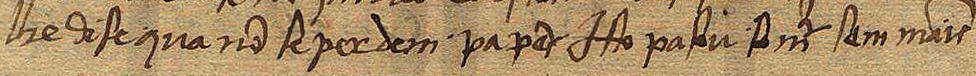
lhe dise que nō se perdem papēs Jsto pasou somte sem mais
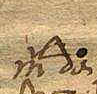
mel dao
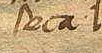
seca
